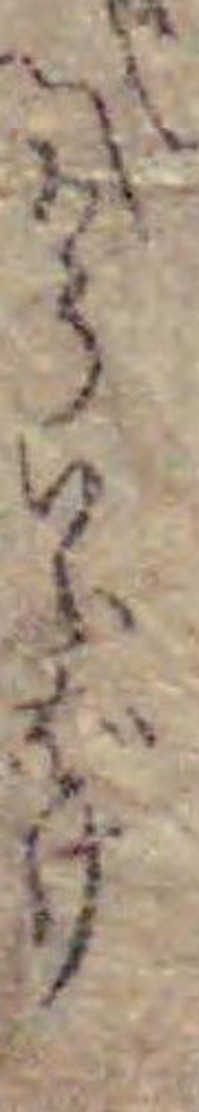〽かういふばけ
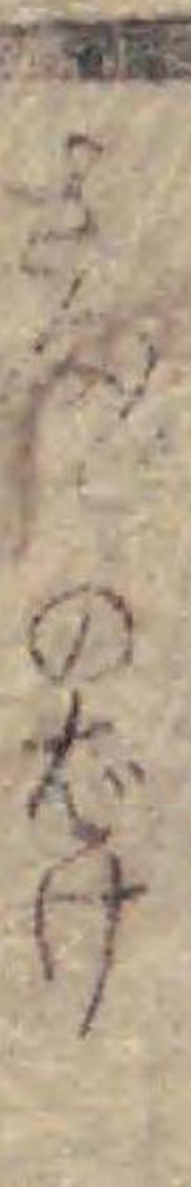さま〴〵のばけ
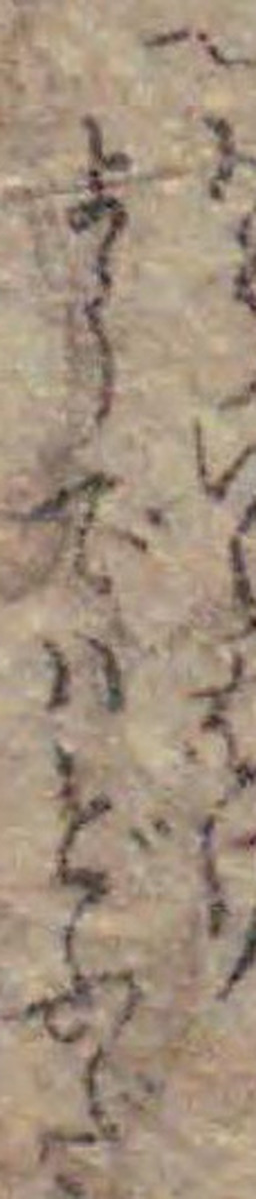ようではどふだ
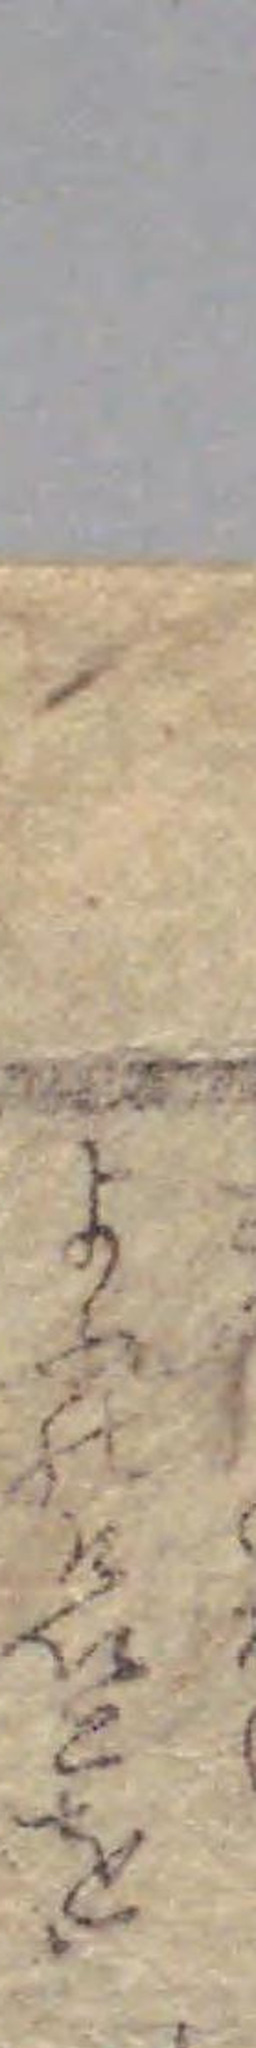よふのけいこを
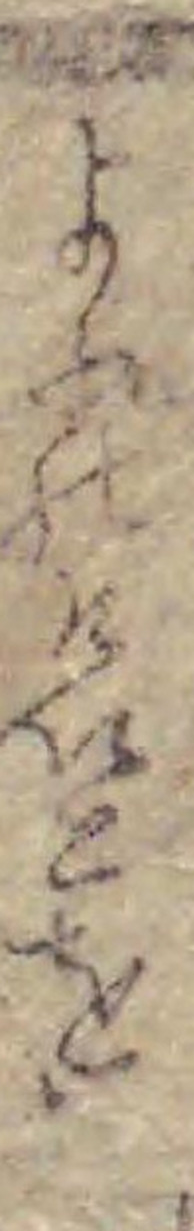よふのけいこを
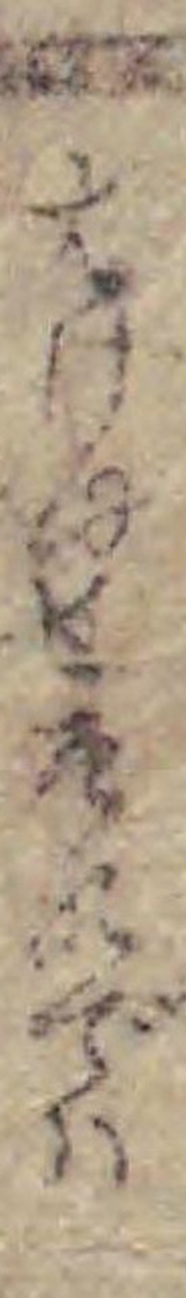はけませそれでは
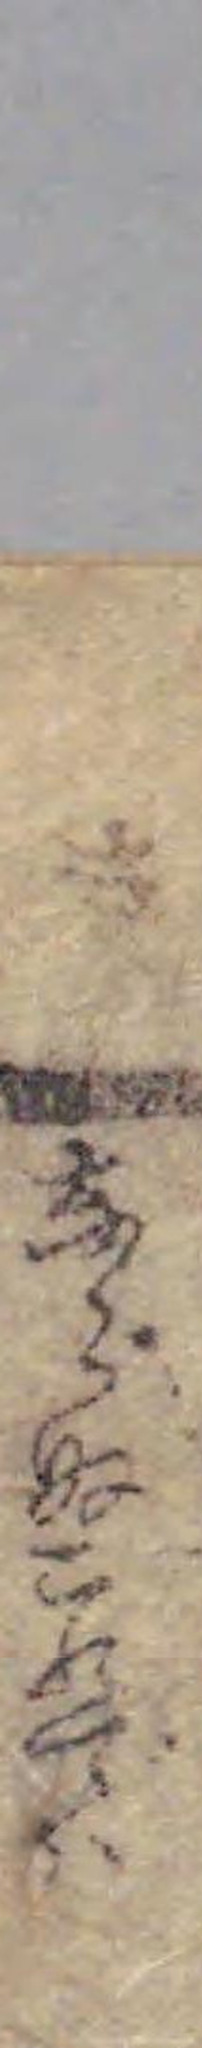ならぬこれでは
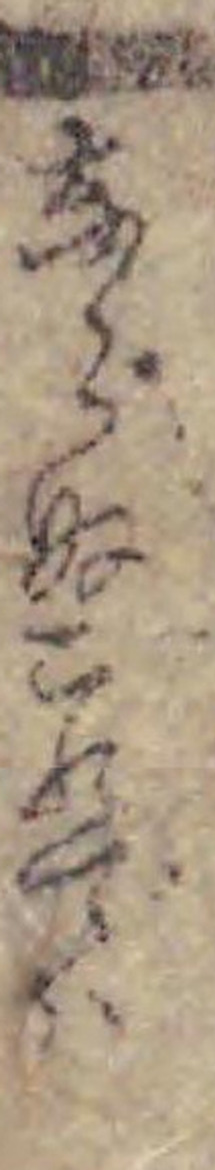ならぬこれでは
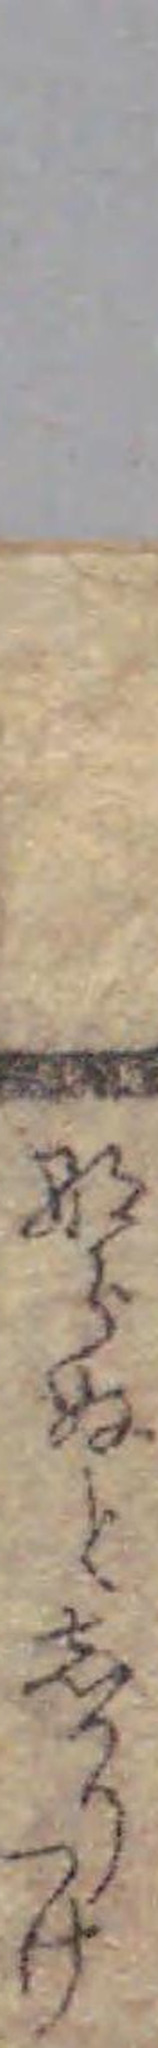ならぬとしかりつけ
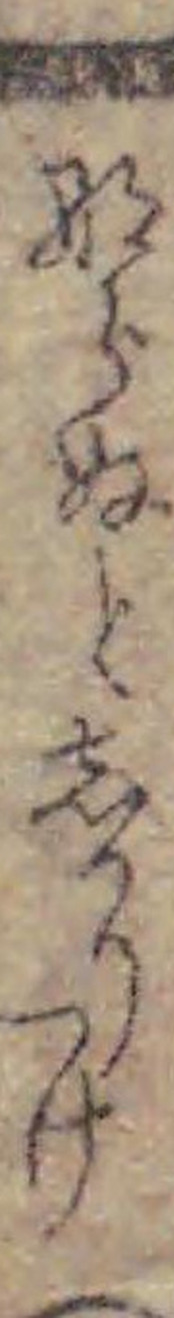ならぬとしかりつけ
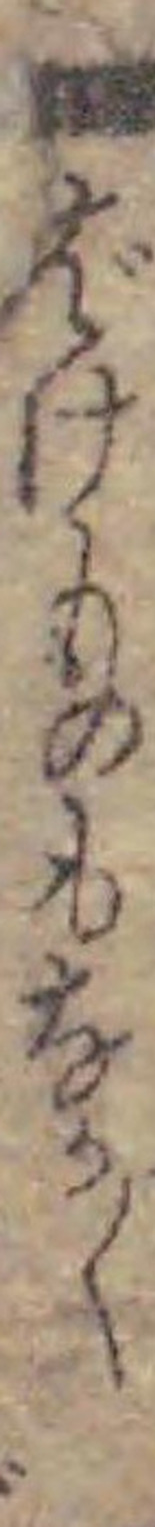ばけものもなか〳〵
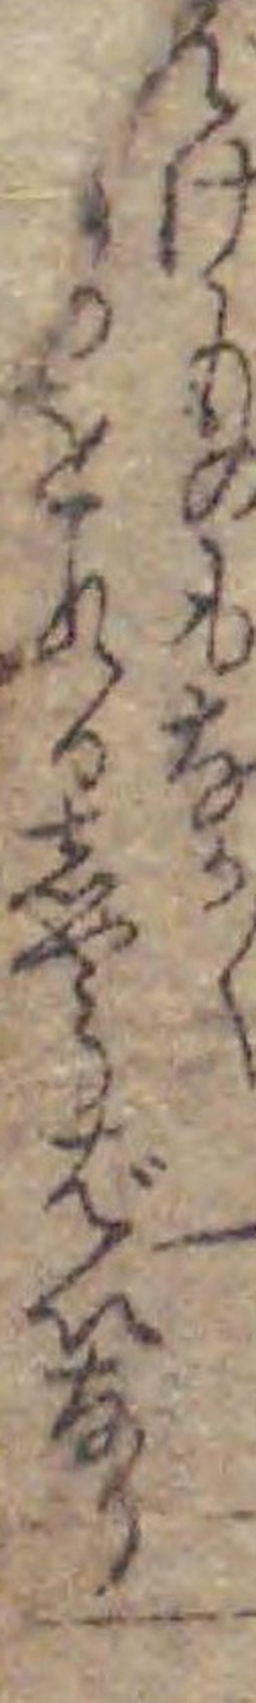をれるしやうばいなり

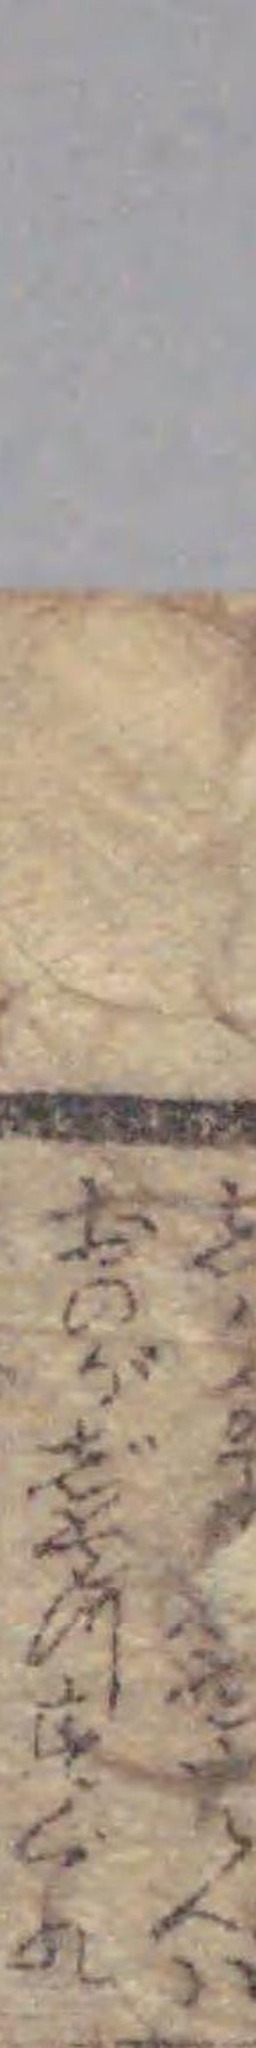おのがじゆつすくれ
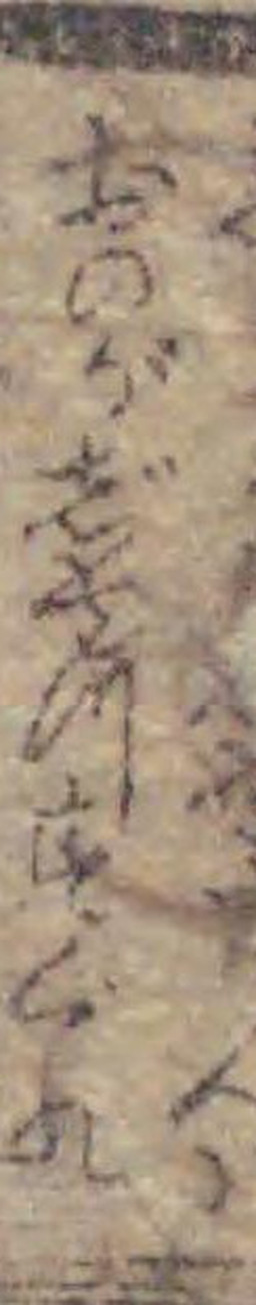おのがじゆつすくれ
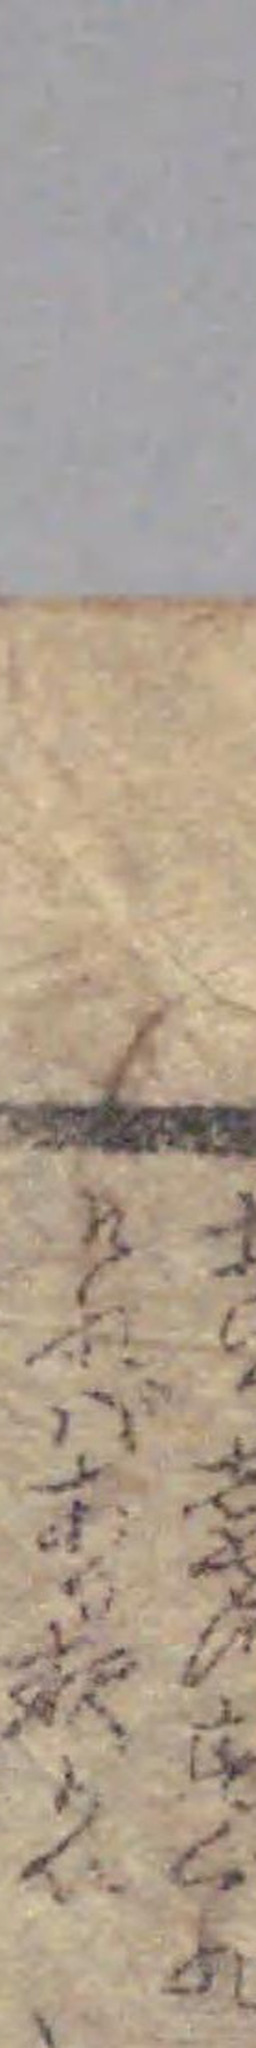ければある夜かい
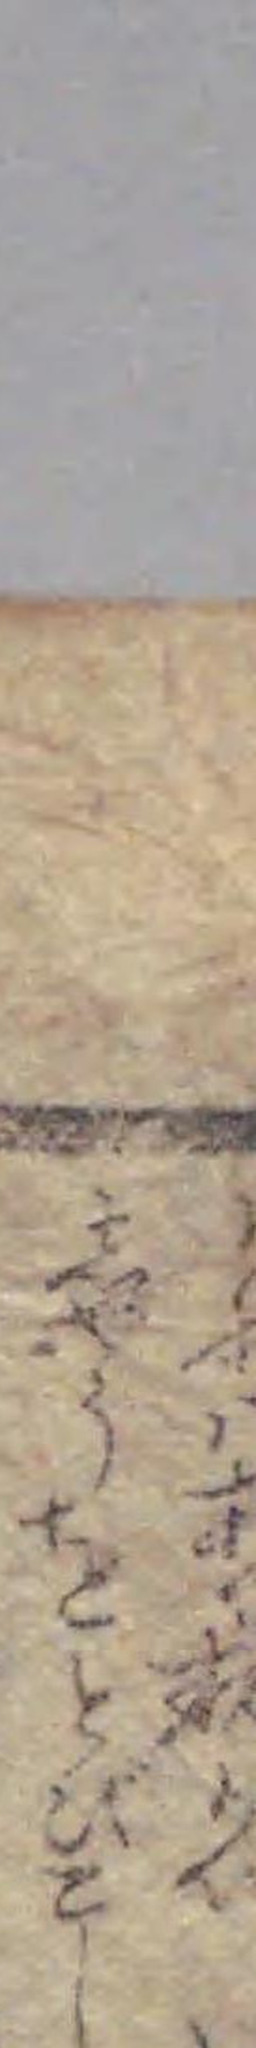しやうをとびこし
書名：化物世界夜半嵐 : 3巻
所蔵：国立国会図書館 National Diet Library, JAPAN
